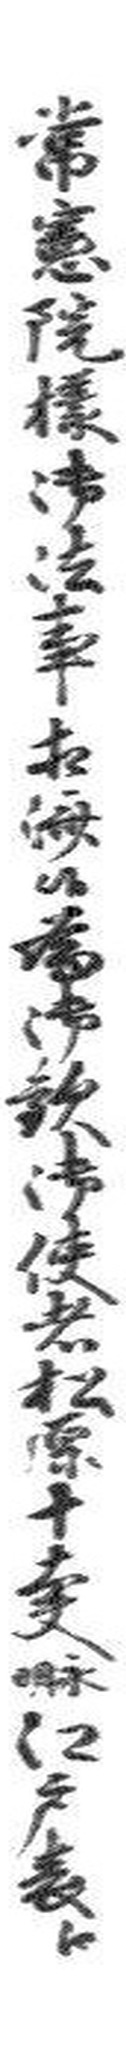常憲院様御法事相済候為御歓御使者松原十太夫永明江戸表江
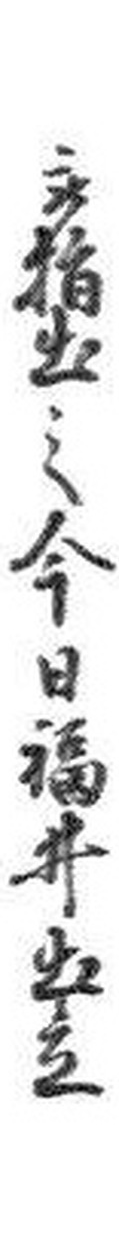被指出之今日福井出立
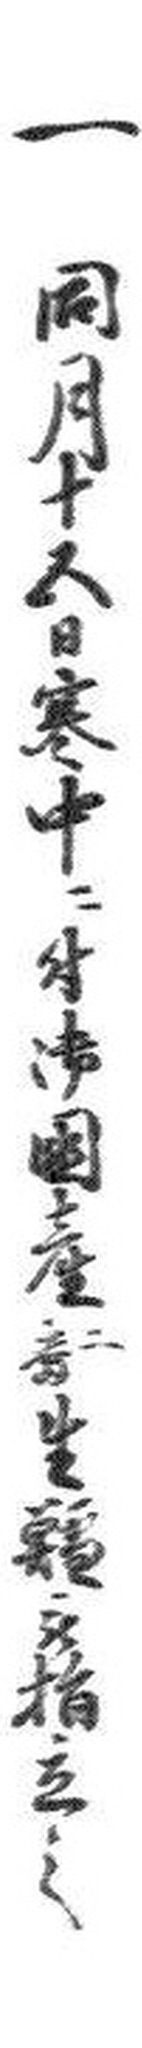一同月十五日寒中ニ付御国産二番生鱈被指立之
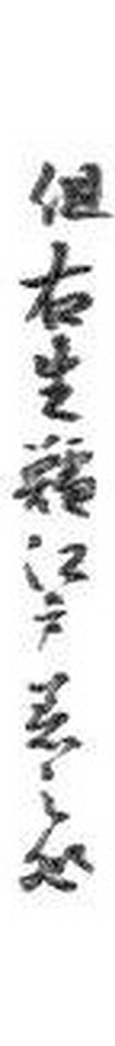但右生鱈江戸着之処
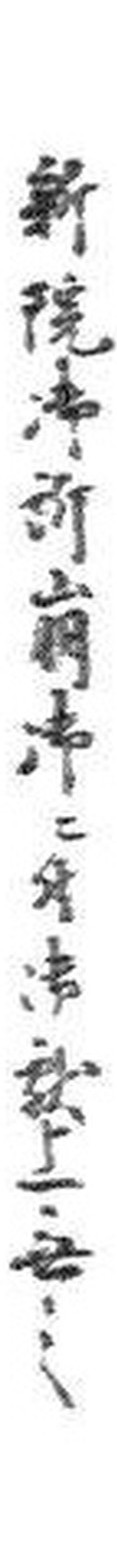新院御所崩御ニ付御献上無之
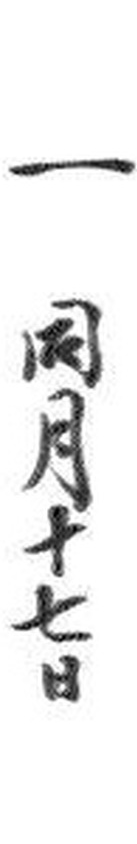一同月十七日
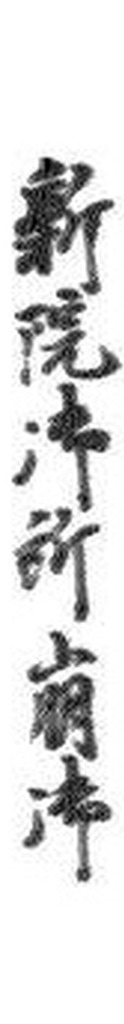新院御所崩御
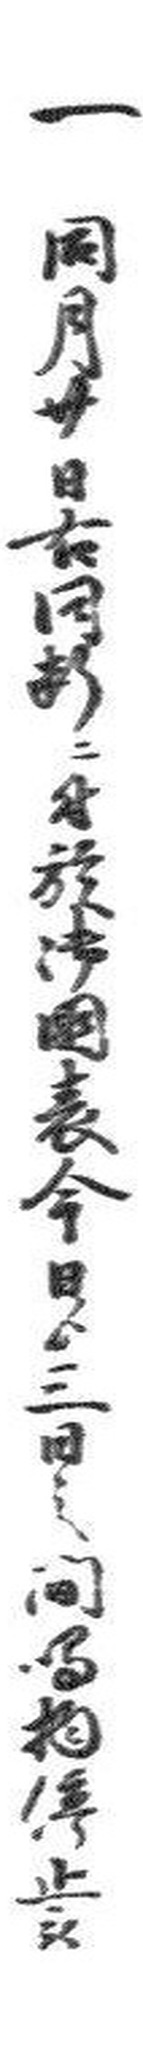一同月廿日右同断ニ付於御国表今日ゟ三日之間鳴物停止被

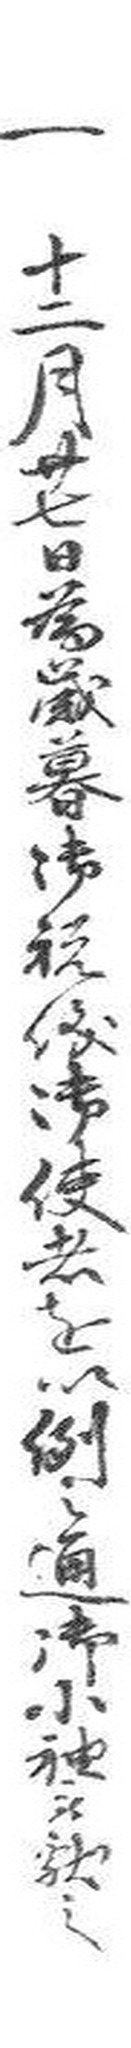一十二月廿七日為歳暮御祝儀御使者を以例之通御小袖被献之
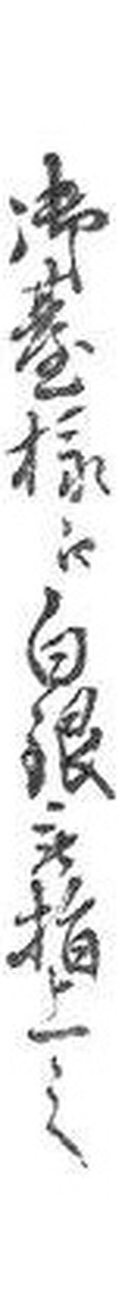御台様江白銀被指上之
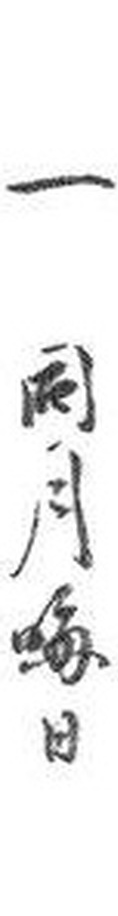一同月晦日
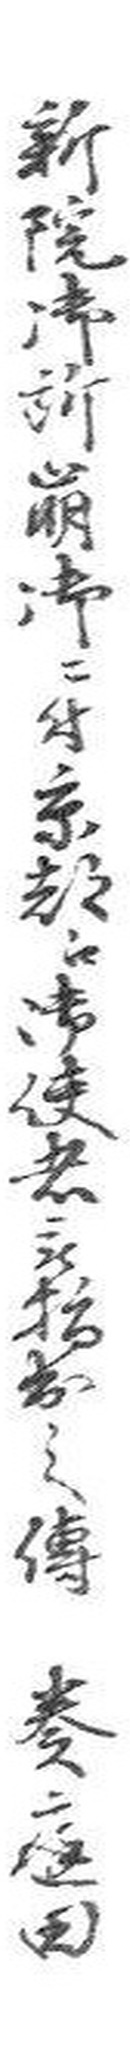新院御所崩御ニ付京都江御使者被指出之傳奏庭田
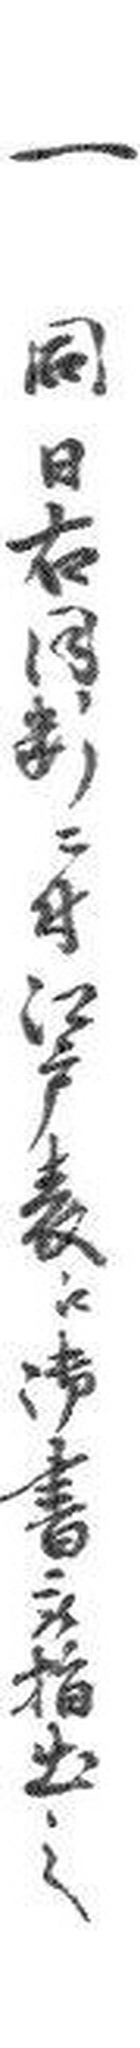一同日右同断ニ付江戸表江御書被指出之
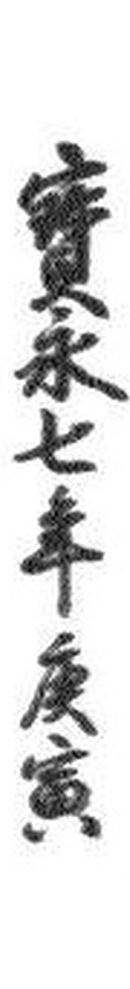宝永七年庚寅
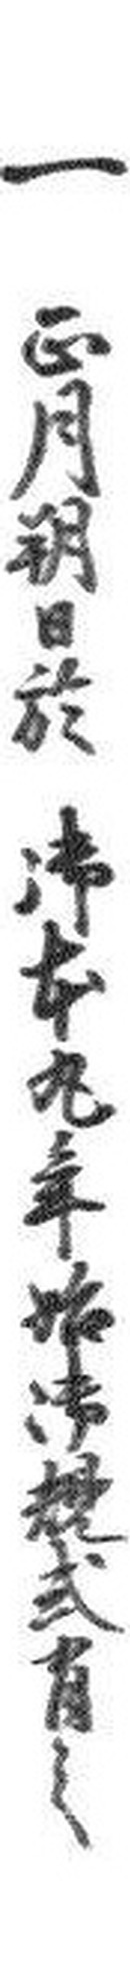一正月朔日於御本丸年始御規式有之
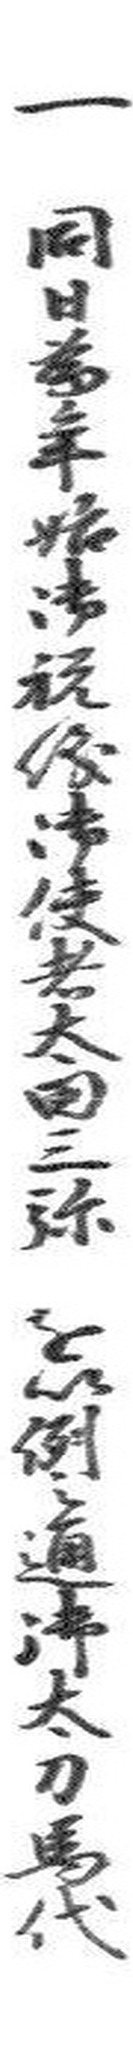一同日為年始御祝儀御使者太田三弥を以例之通御太刀馬代
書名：家譜 二十五 吉品公 従宝永六年到同七年
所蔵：福井県文書館 Fukui Prefectural Archives
